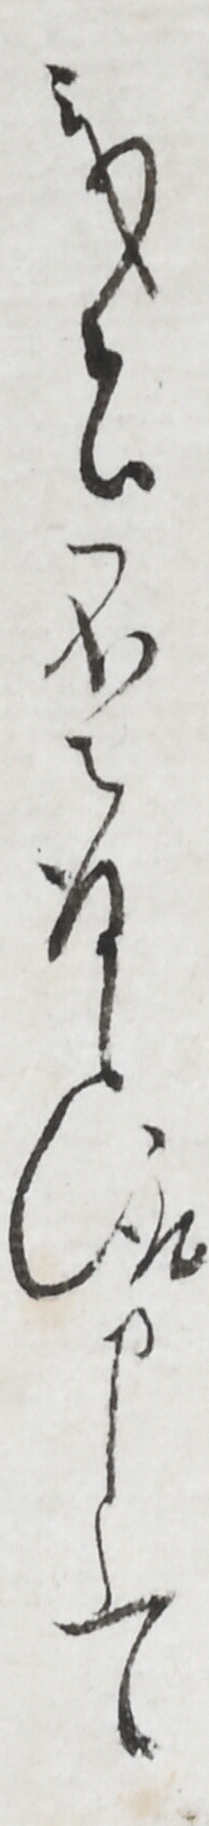義は不奉存候趣申上候
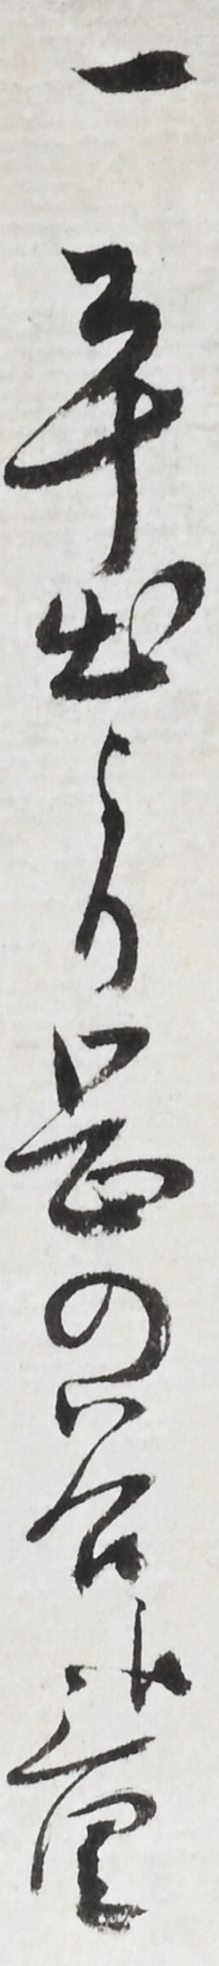一平出より岡の谷え三里
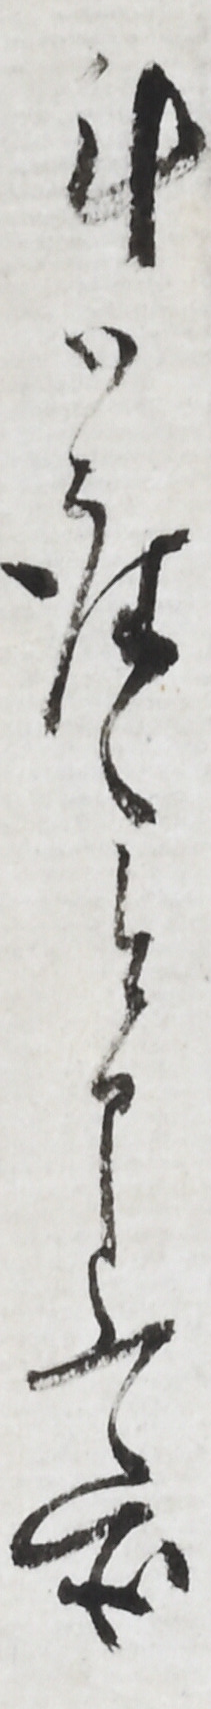斗御座候と申上候所
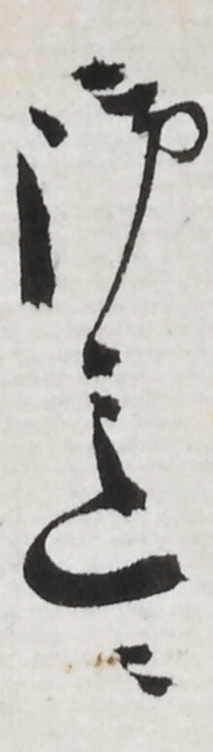御意ニ
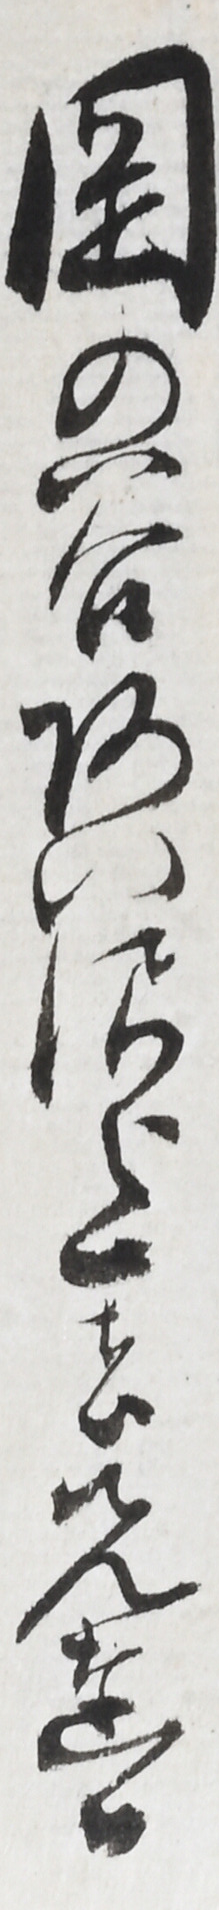岡の谷あい沢迄は先達而
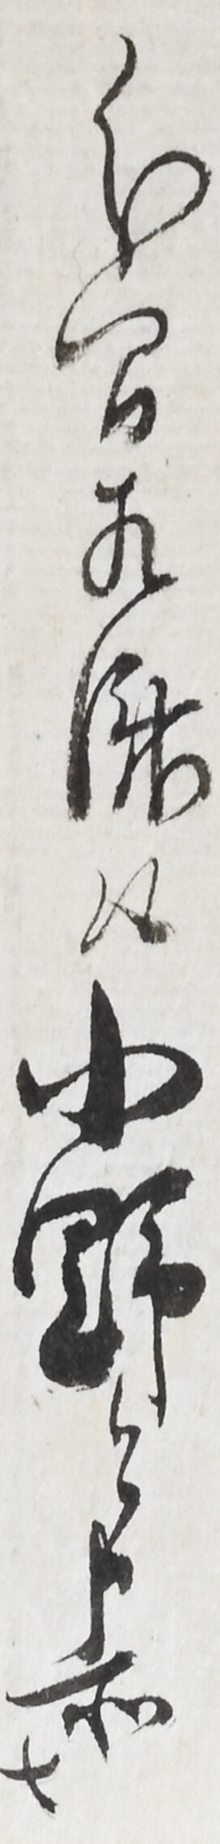分間相済候小野と申所は
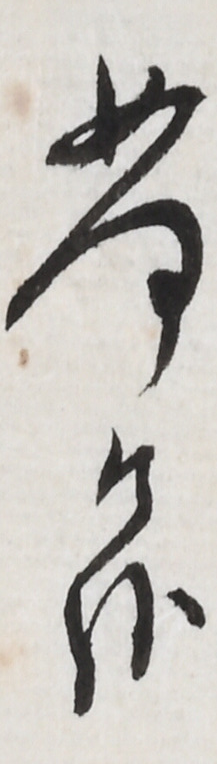如何候哉
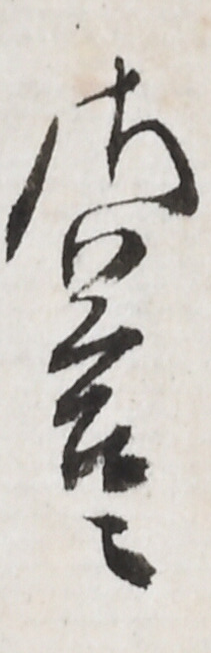御答ニ
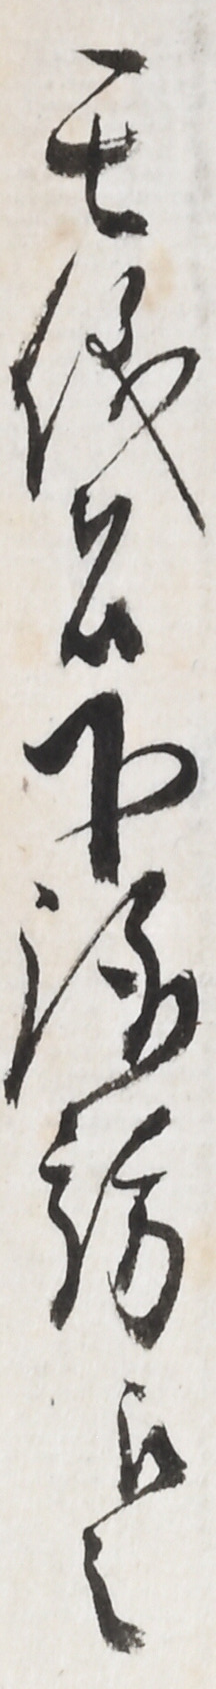其儀は下諏訪え之
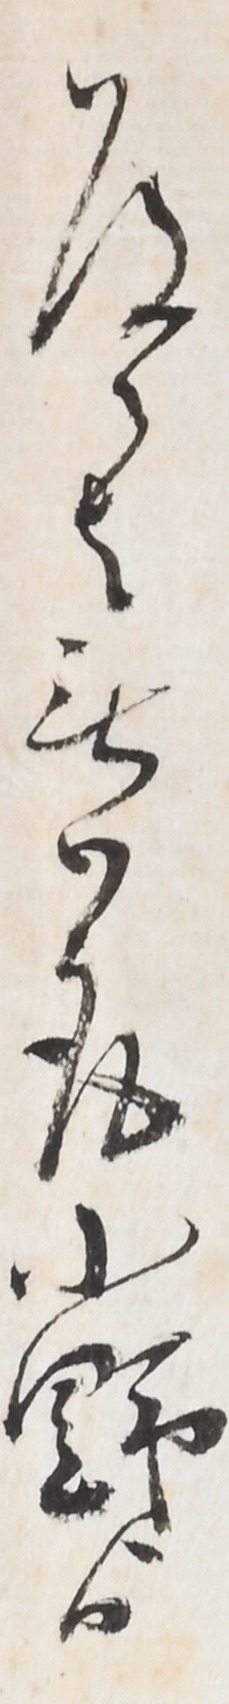道ニは無御座小野ゟは
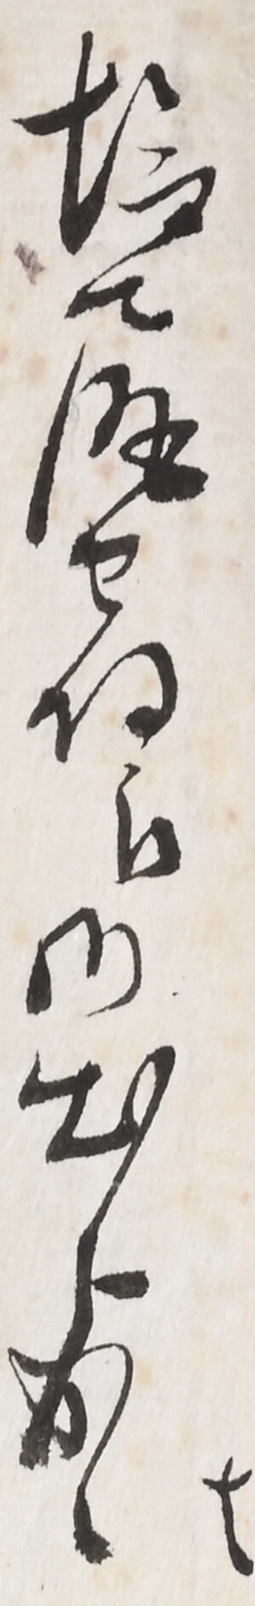塩尻宿え御出被成候
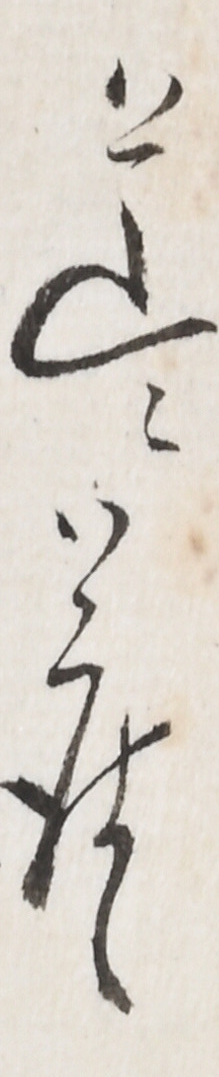道ニ御座候
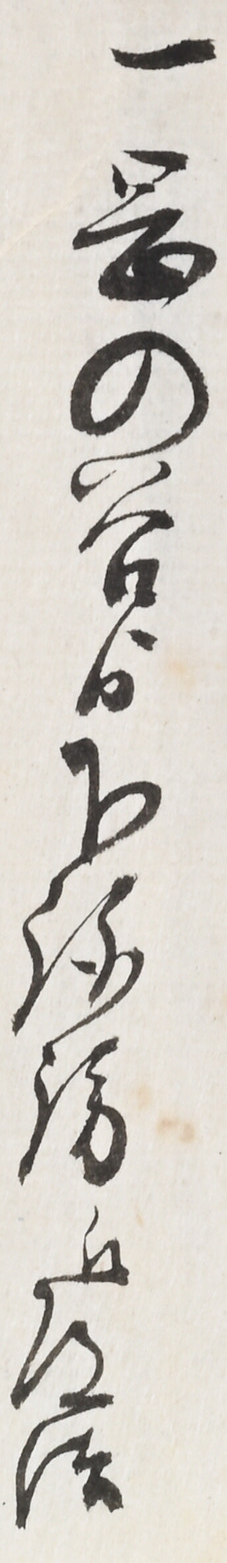一岡の谷ゟ下諏訪え道法
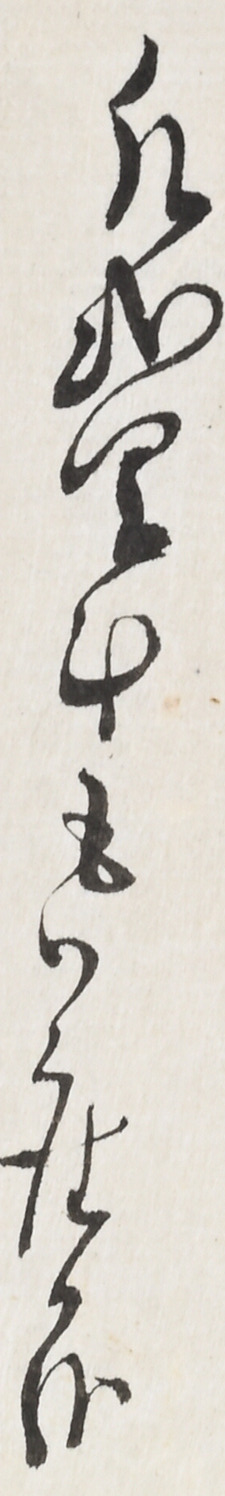凡弐里斗も御座候哉
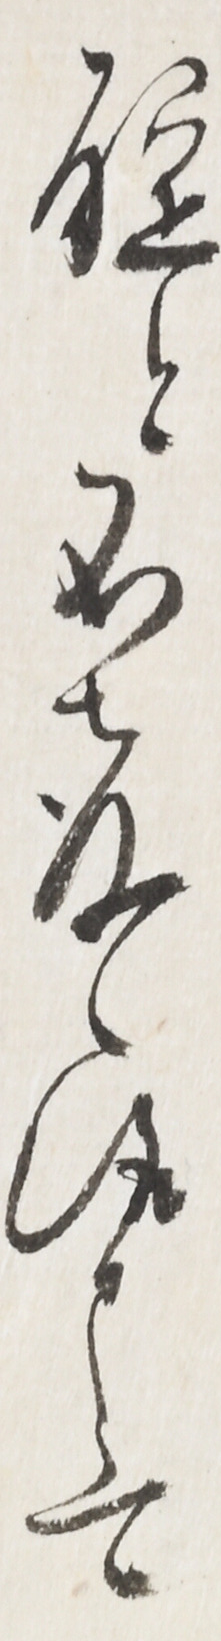聢と不奉存候趣申上候
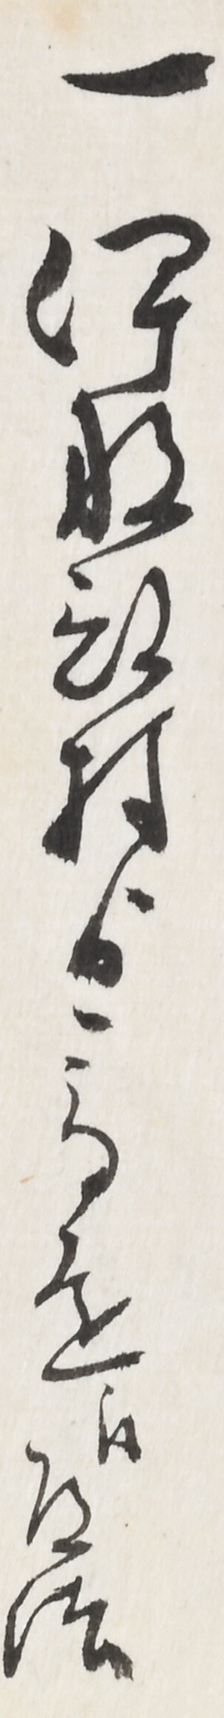一伊那部村ゟ高遠え道法
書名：御測量方御出ニ付三州迄罷出御窺聞合覚書
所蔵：伊那市立高遠町図書館・合同会社AMANE
